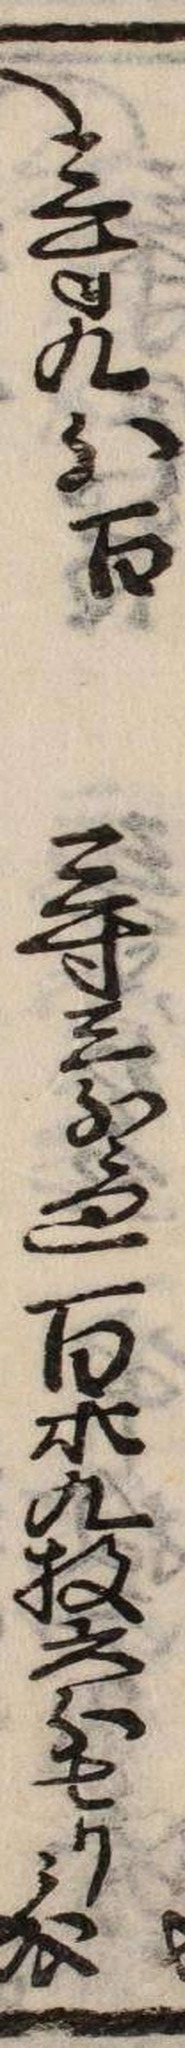三寸九分百三寸三分に廻百丗九枚六分七りに成
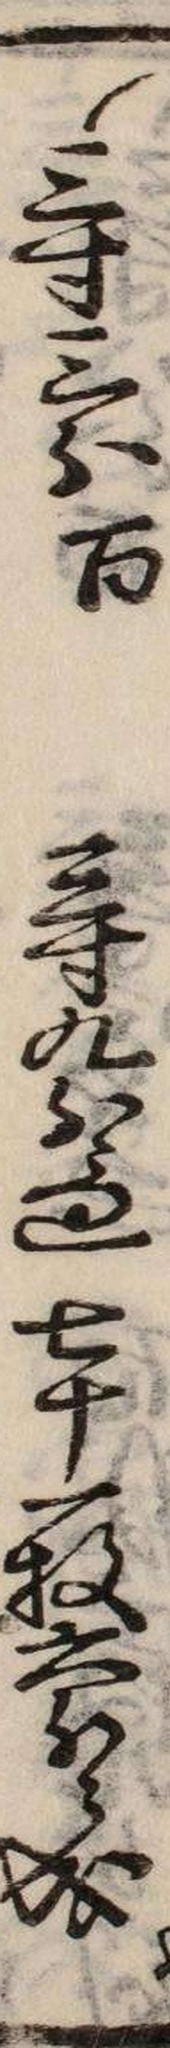三寸三分百三寸九分に廻七十一枚六分に成
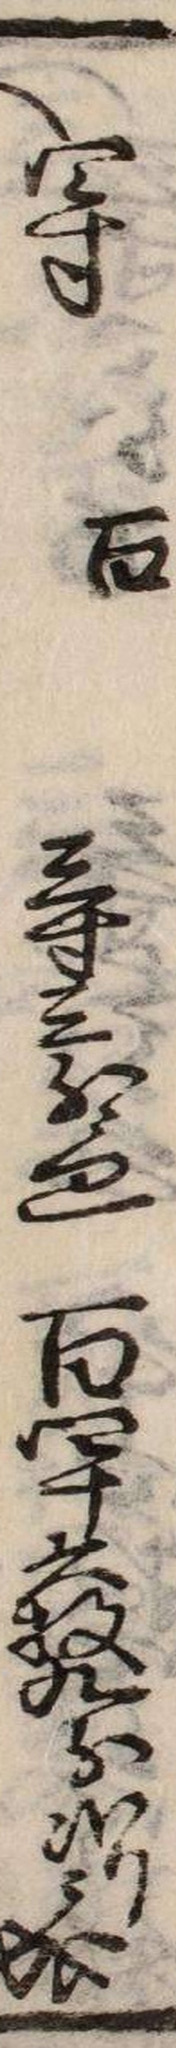四寸百三寸三分に廻百四十六枚九分弐りに成
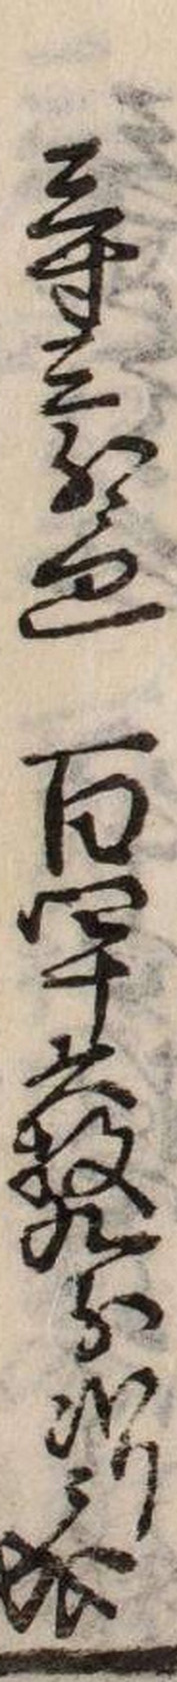四寸百三寸三分に廻百四十六枚九分弐りに成
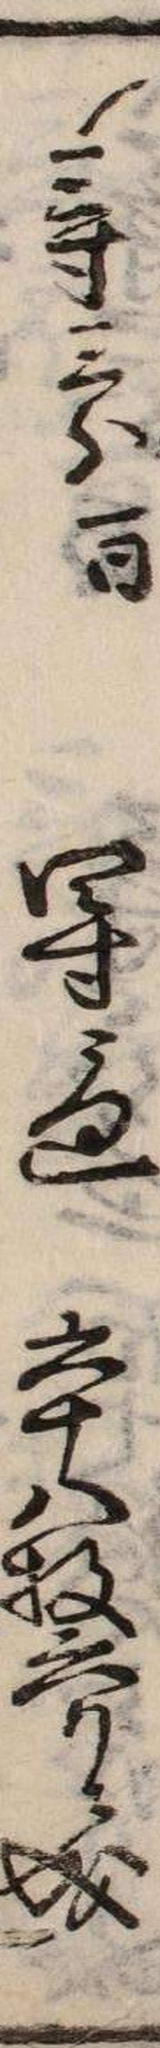三寸三分百四寸に廻六十八枚六りに成
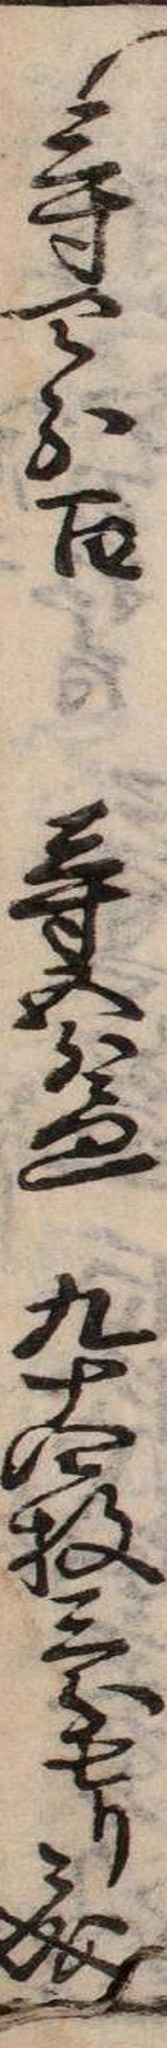三寸四分百三寸五分に廻九十四枚三分七りに成

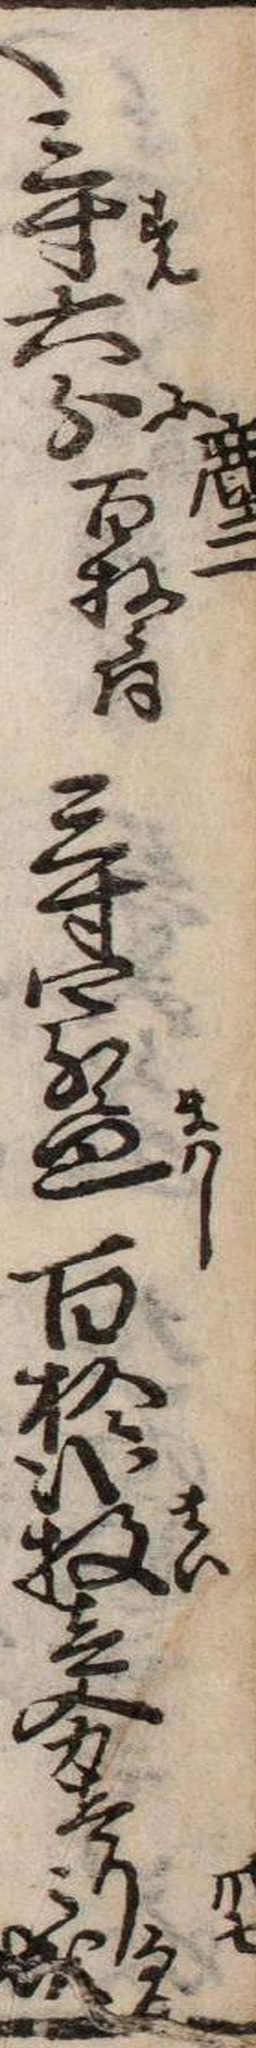三寸六分百枚に付三寸四分に廻百拾弐枚壱分壱りに成
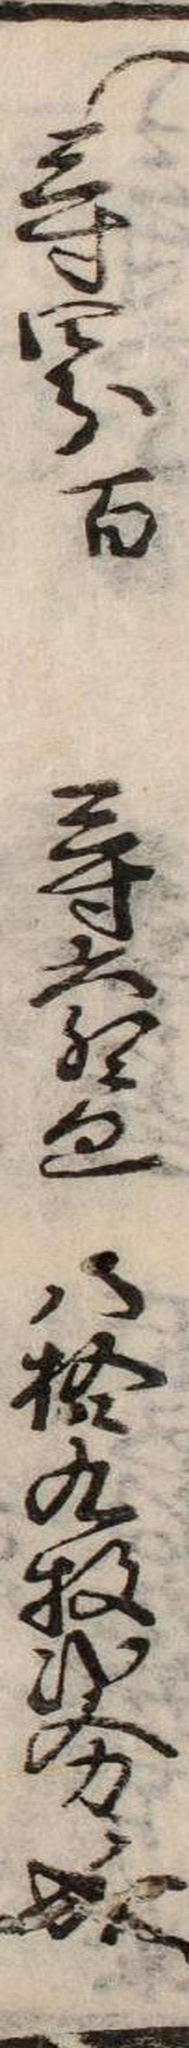三寸四分百三寸六分に廻八拾九枚弐分に成
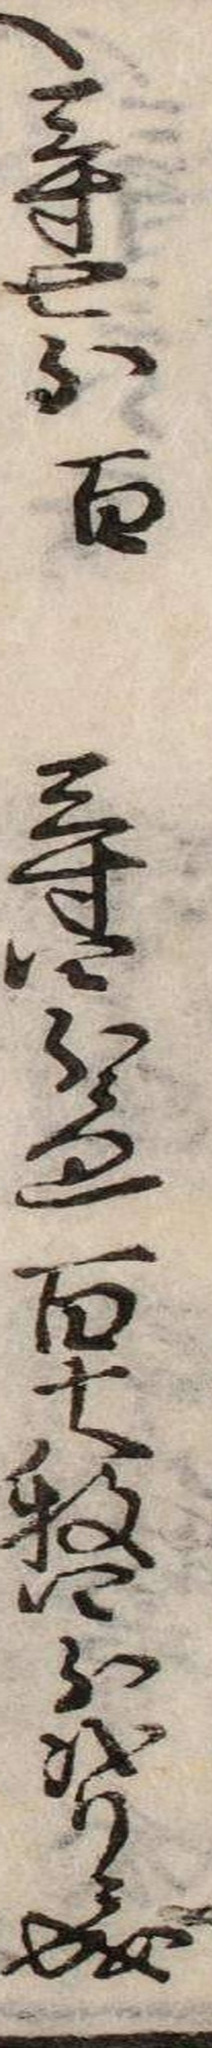三寸七分百三寸四分に廻百十八枚四分弐りに成
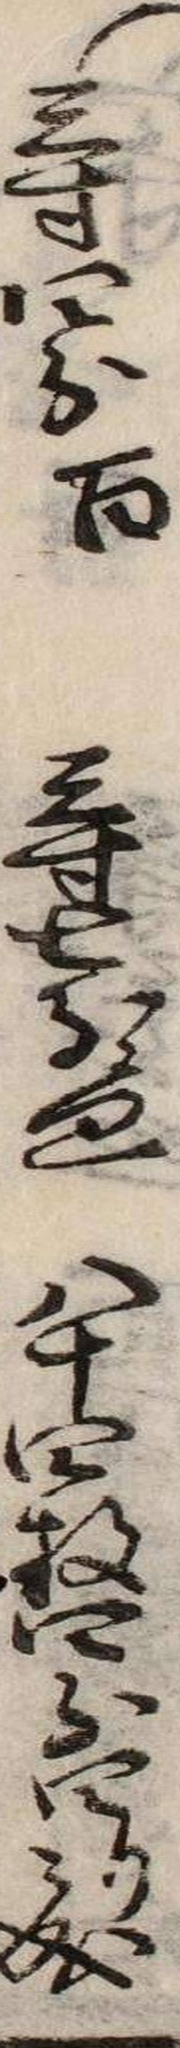三寸四分百三寸七分に廻八十四枚四分四りに成
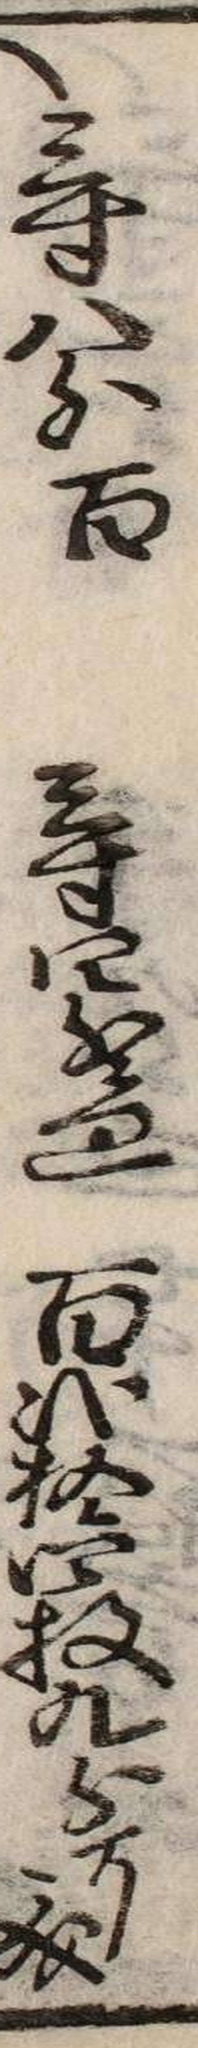三寸八分百三寸四分に廻百弐拾四枚九分一りに成
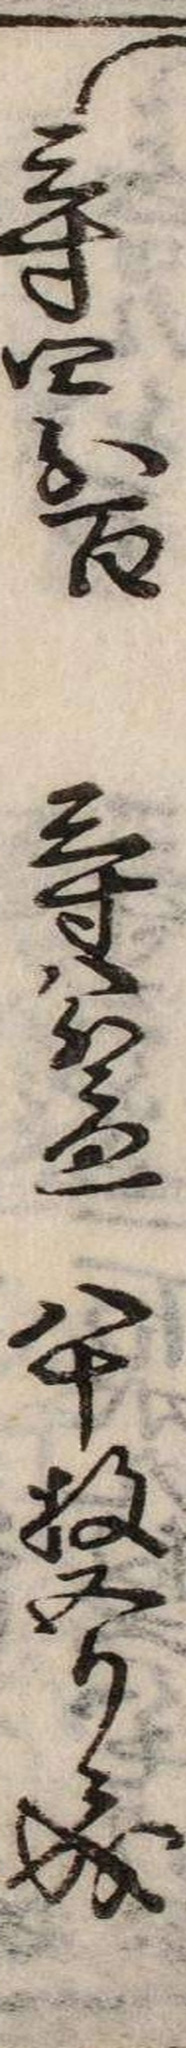三寸四分百三寸八分に廻八十枚五りに成
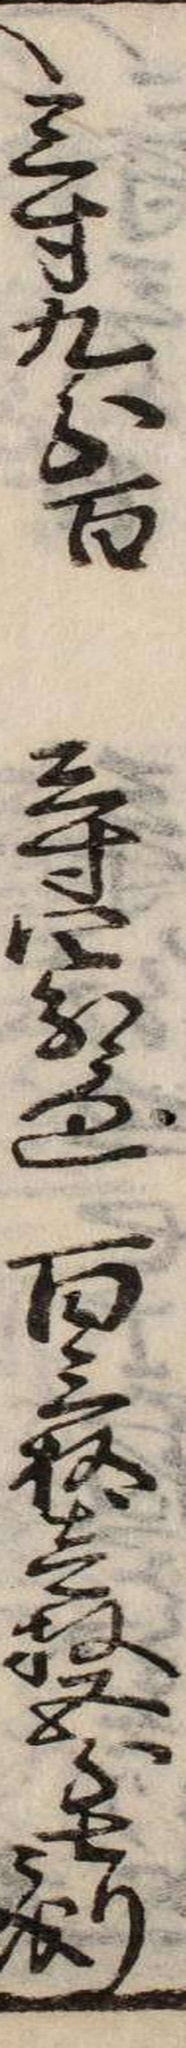三寸九分百三寸四分に廻百三拾壱枚五分七りに成
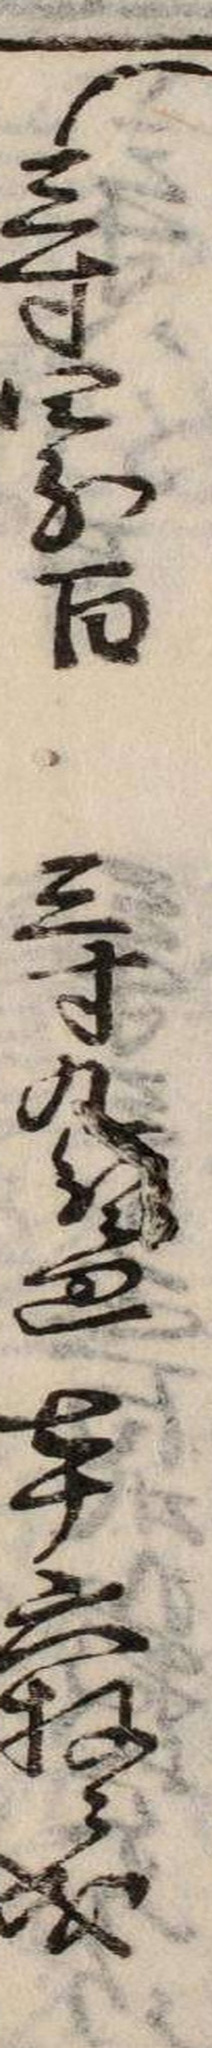三寸四分百三寸九分に廻七十六枚に成
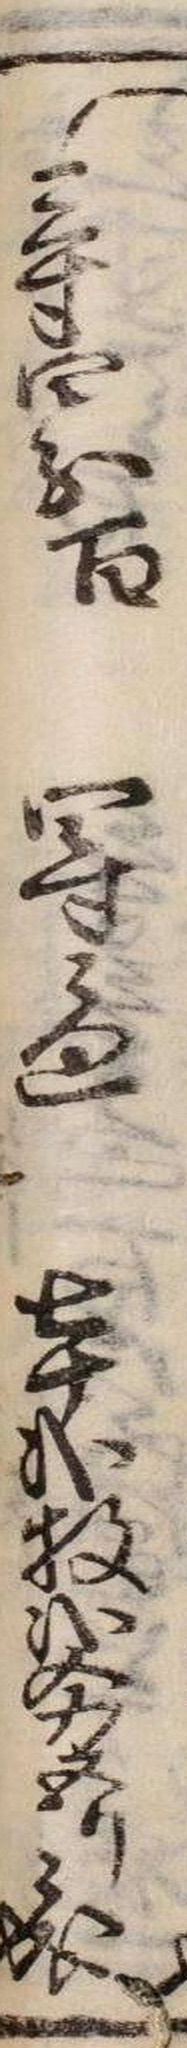三寸四分百四寸に廻七十弐枚弐分五りに成
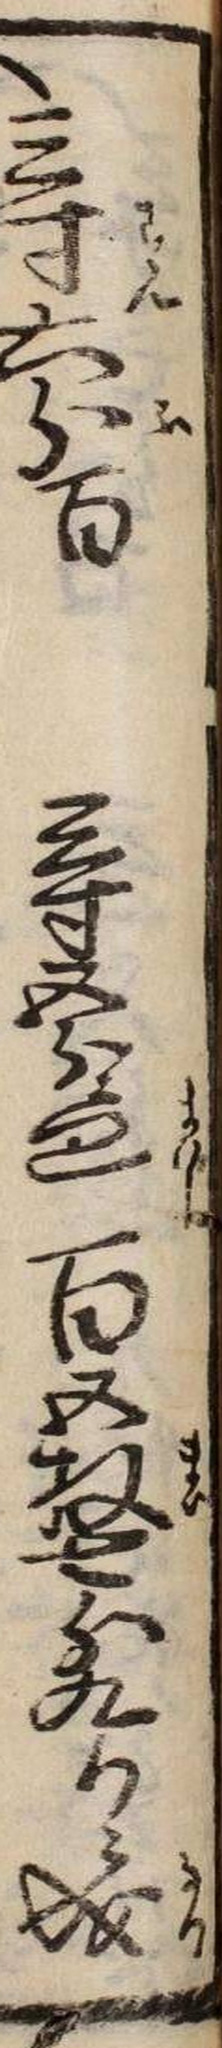三寸六分百三寸五分に廻百五枚七分九りに成
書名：塵劫記（寛永11年自跋、京都府立京都学・歴彩館追貴8）
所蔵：京都府立京都学・歴彩館 国文学研究資料館
